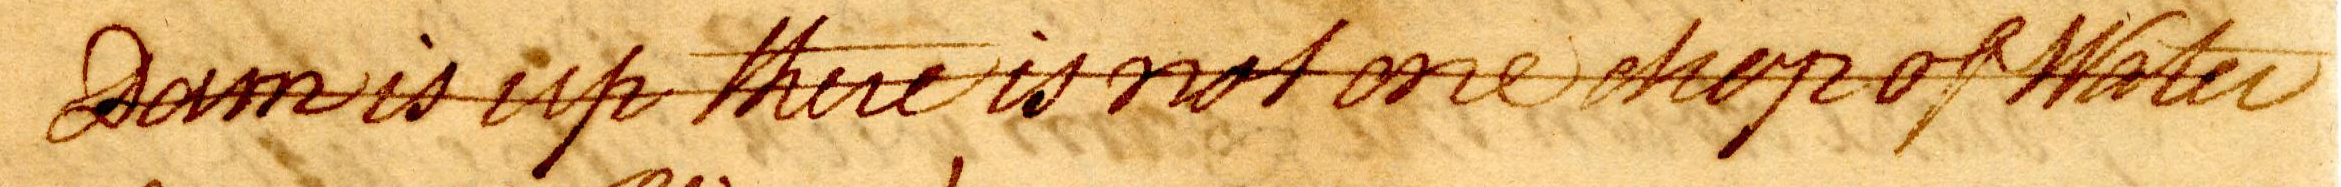[Dam is up there is not one drop of Water]
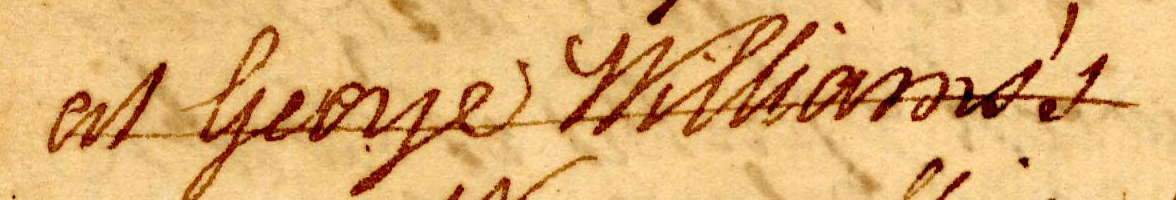[at George Williams's]
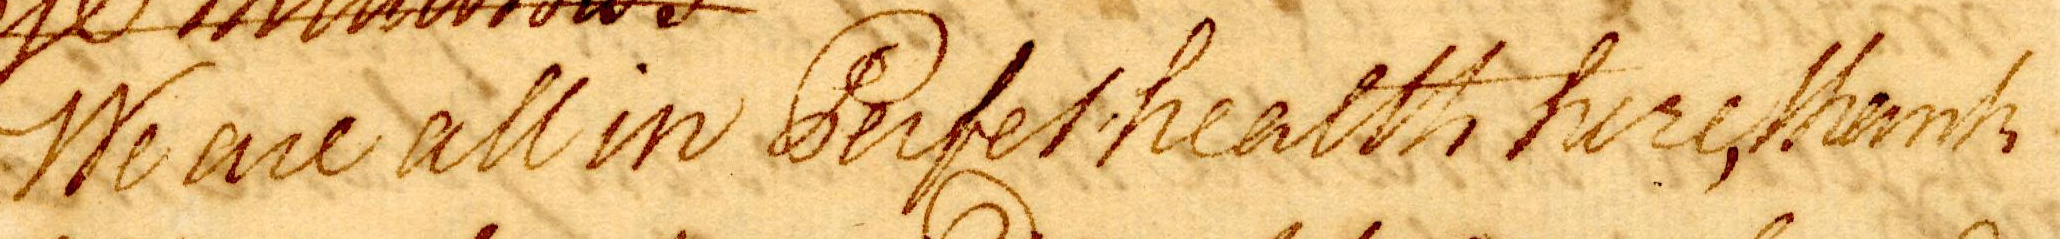We are all in Perfet health here, thanks
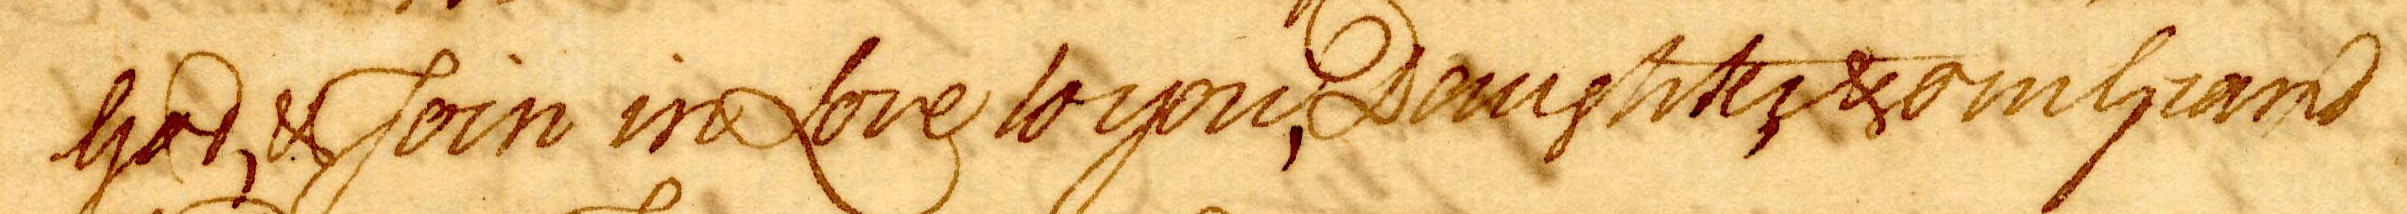God & join in Love to you, Daughters & our Grand
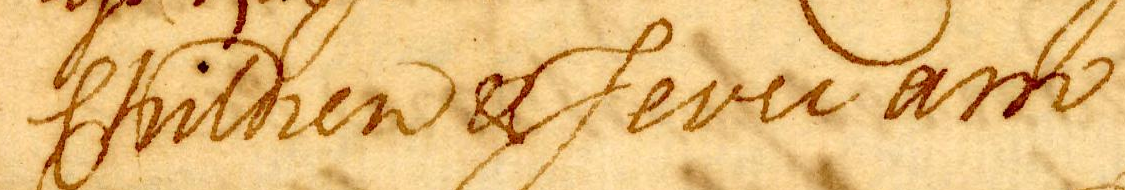Children & I ever am
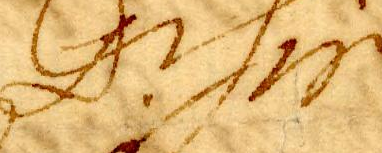D^r Sir
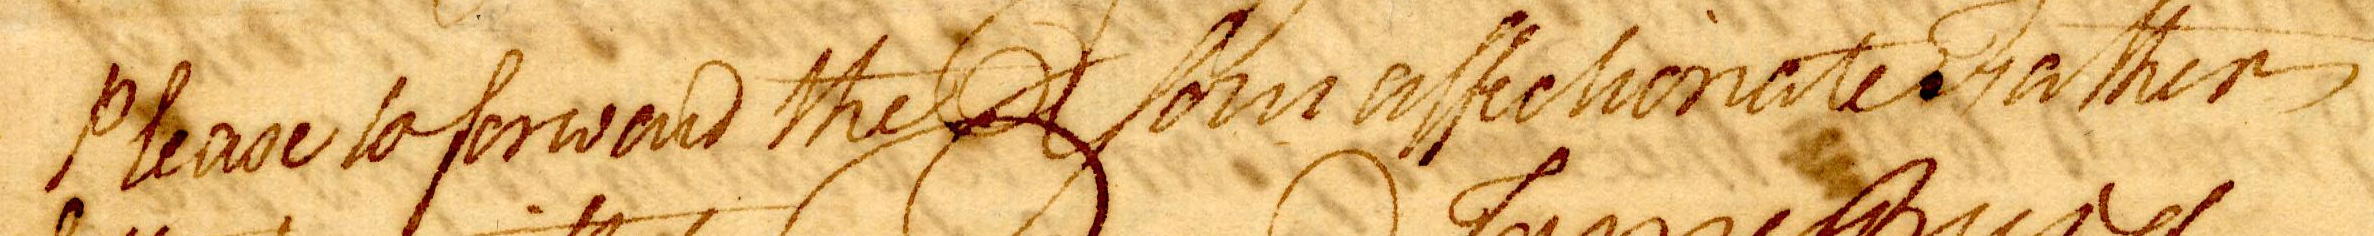Please to forward the Your affectionate Father
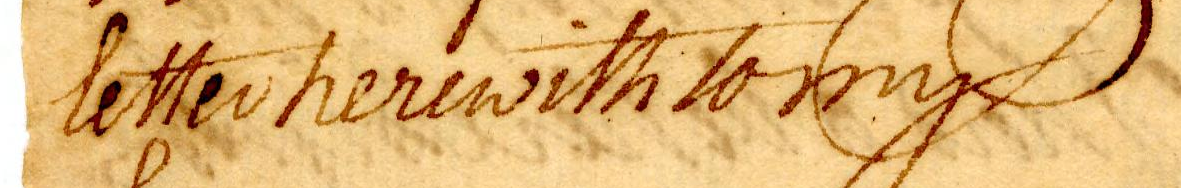letter herewith to my
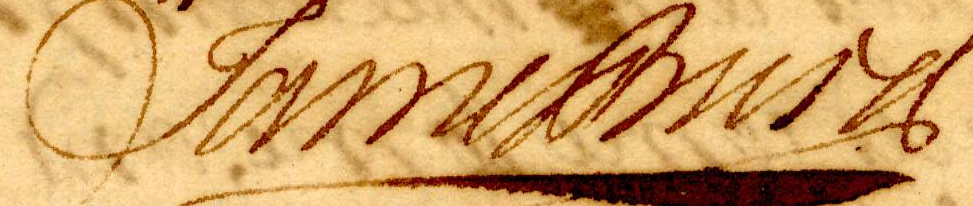James Burd
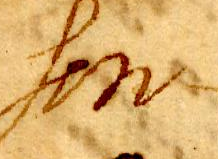Son
